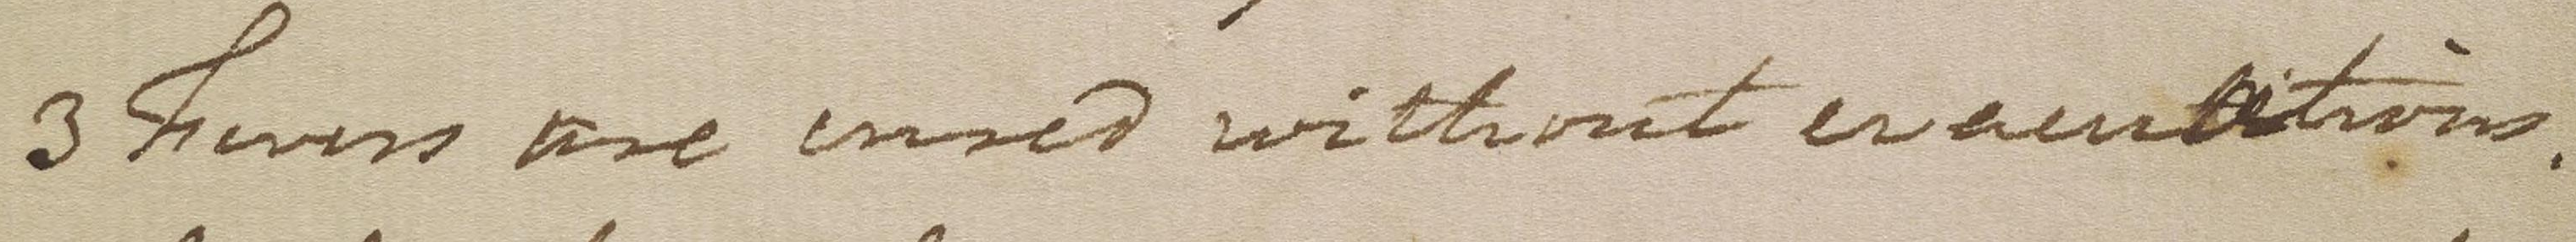3 Fevers are cured without evacuations.
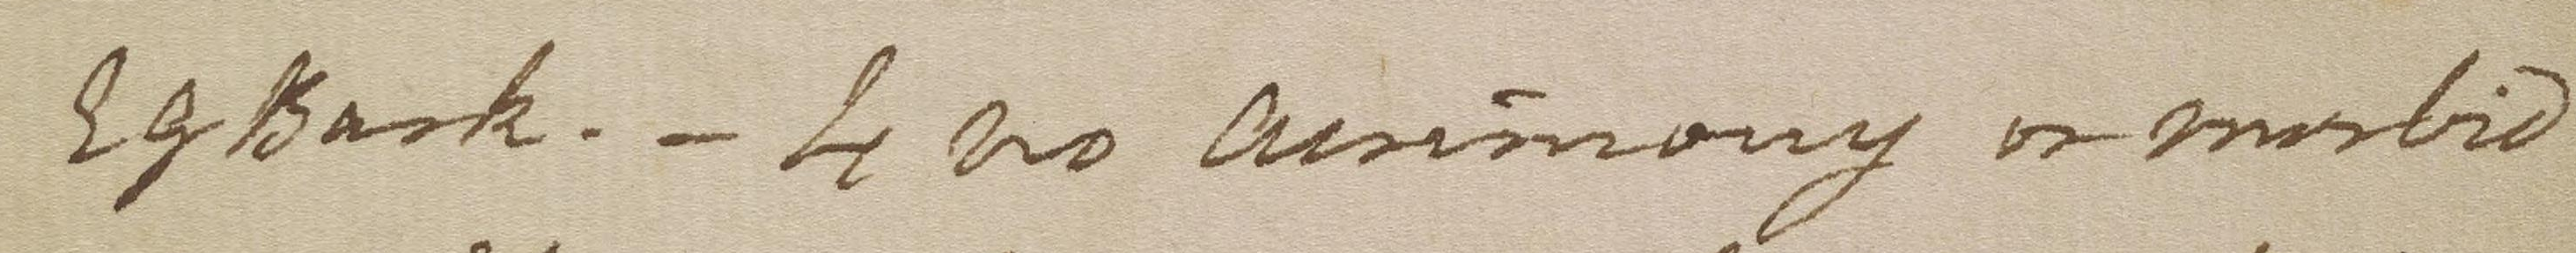E.g Bark.- 4 No acrimony or morbid
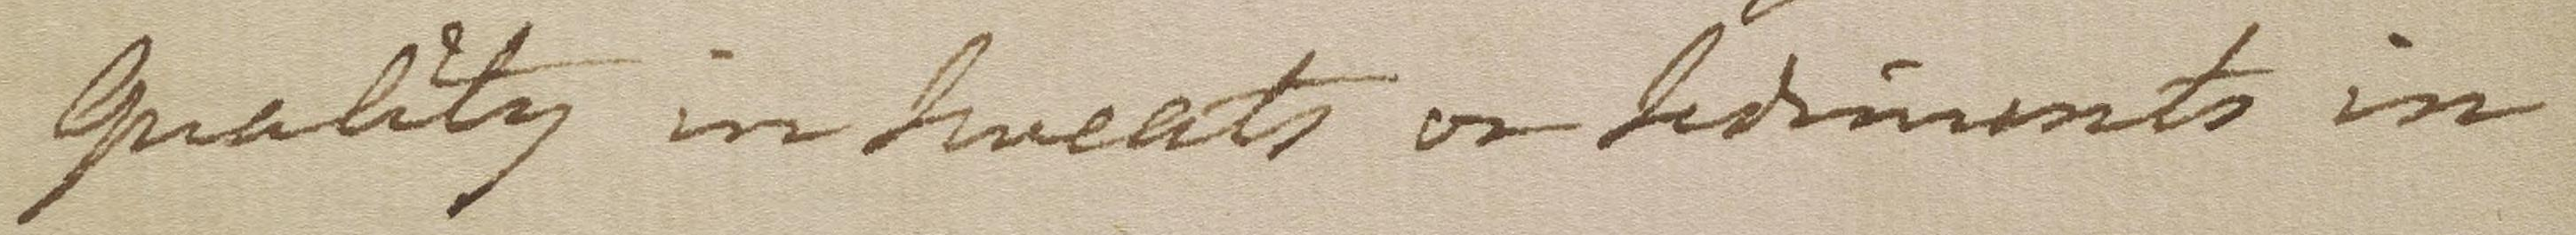gravity in sweats or scerinents in
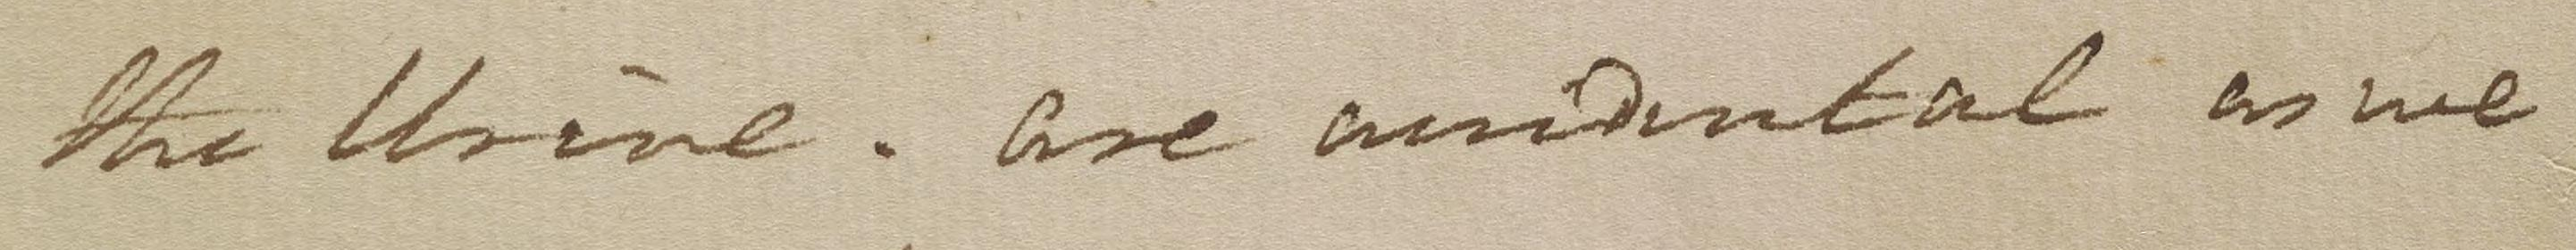the Urine are accidental as we
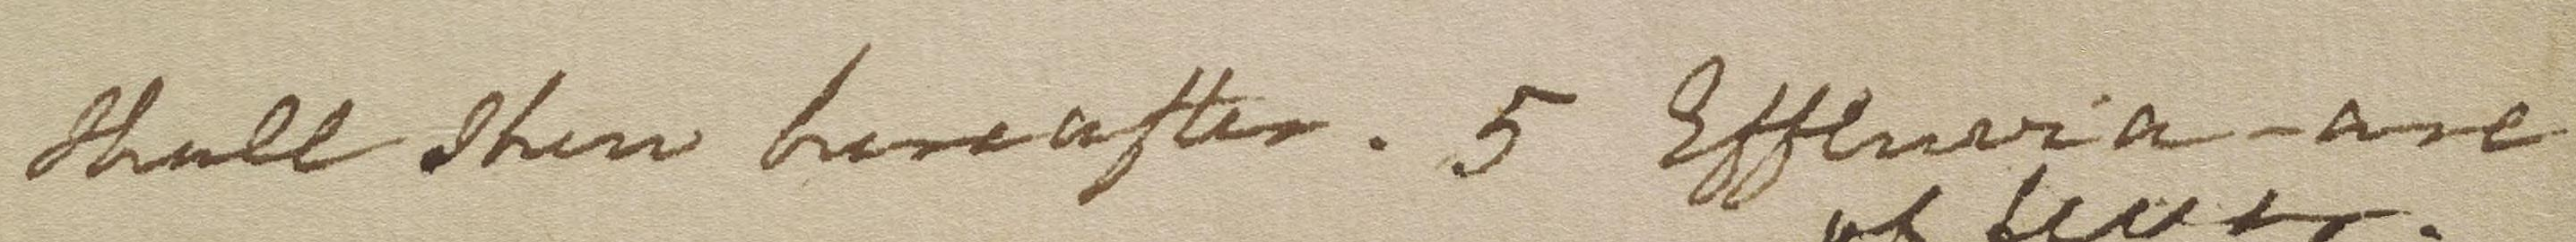shall show hereafter. 5 Effluvia are
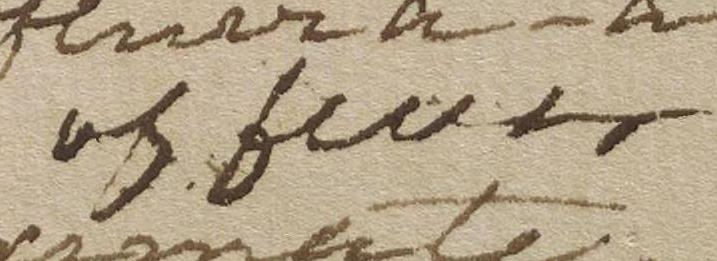of fever
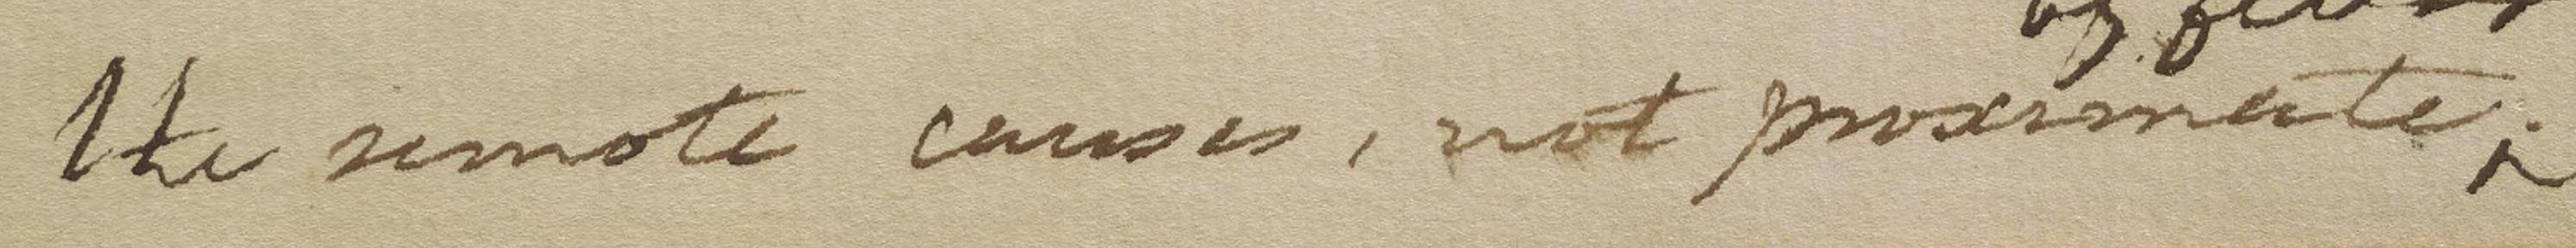the remote causes, not proximate,
